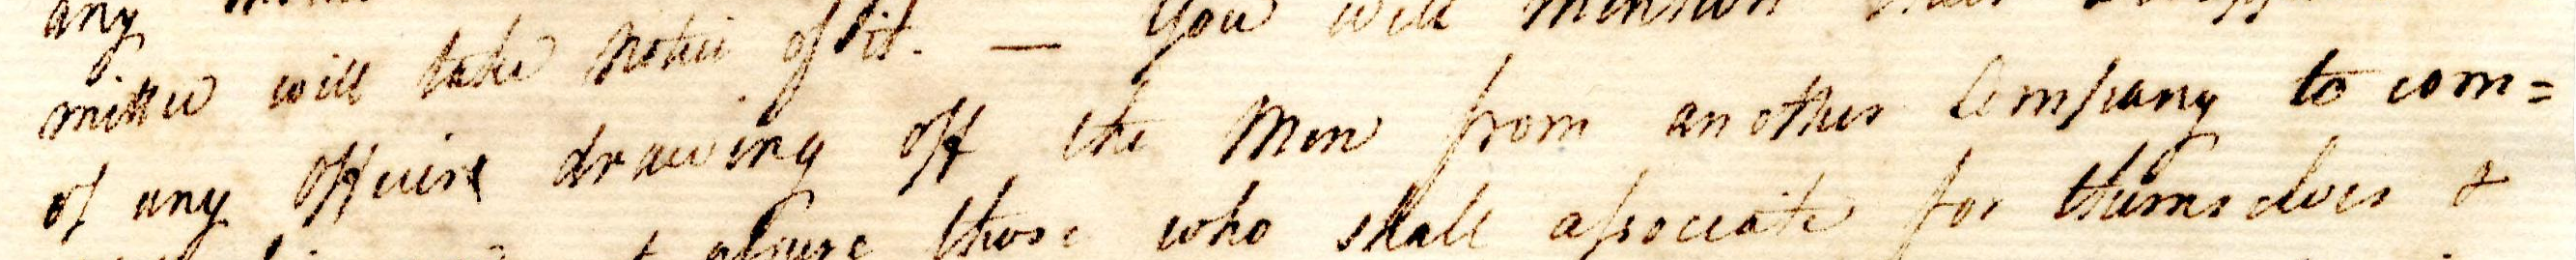of any officers drawing off the Men from another Company to com-
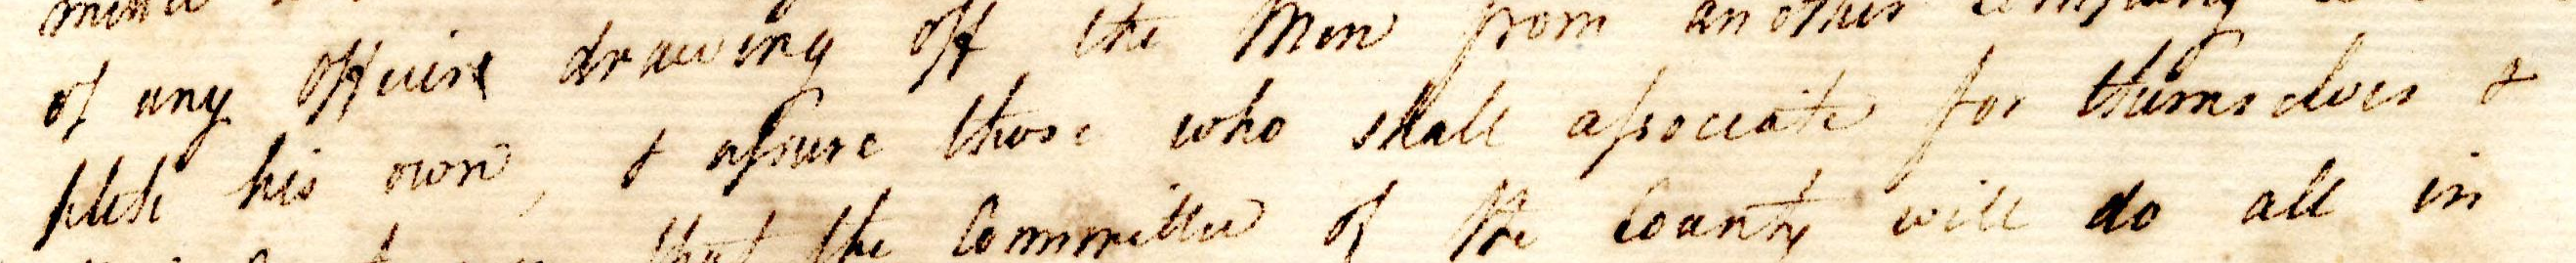-plete his own, & assure those who shall associate for themselves &
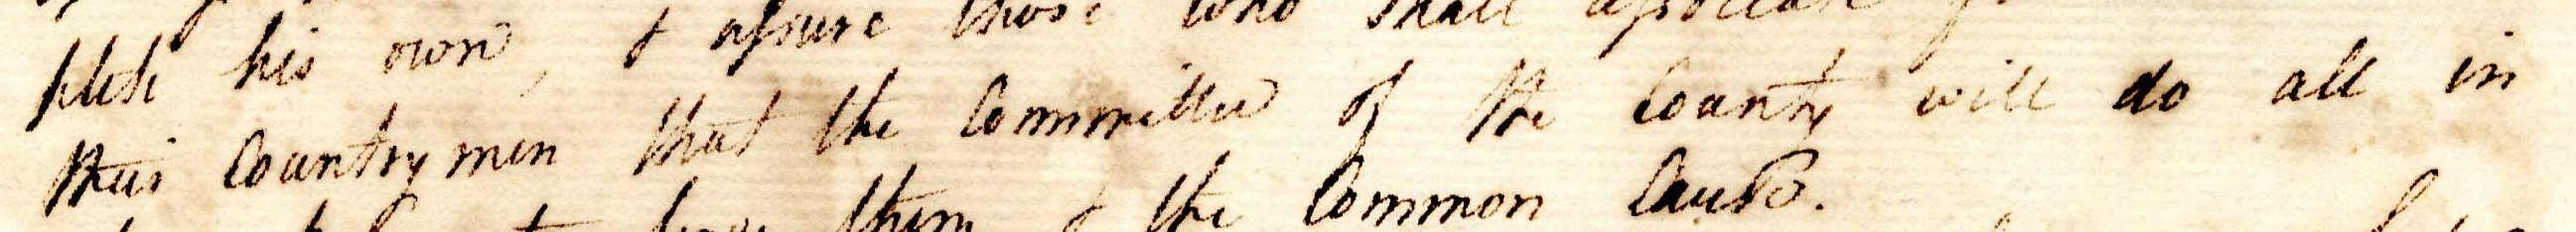their Country men that the Committee of the County will do all in
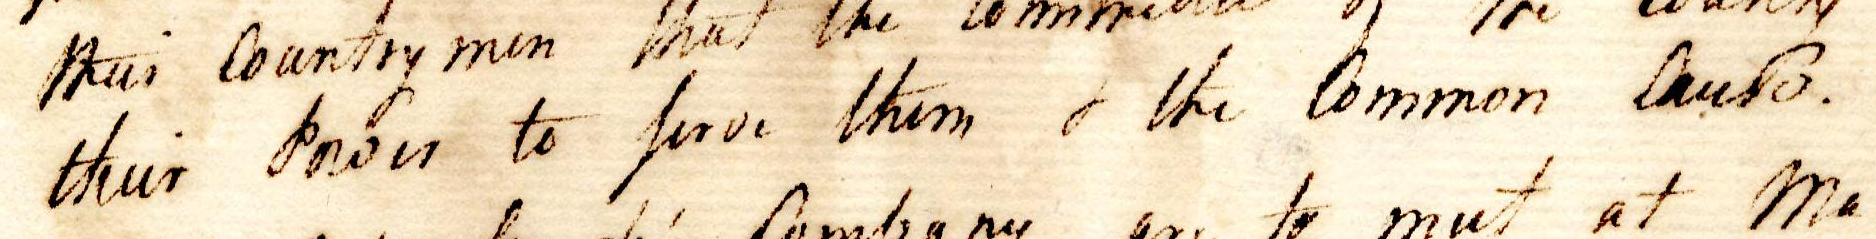their Power to serve them & the Common Cause.
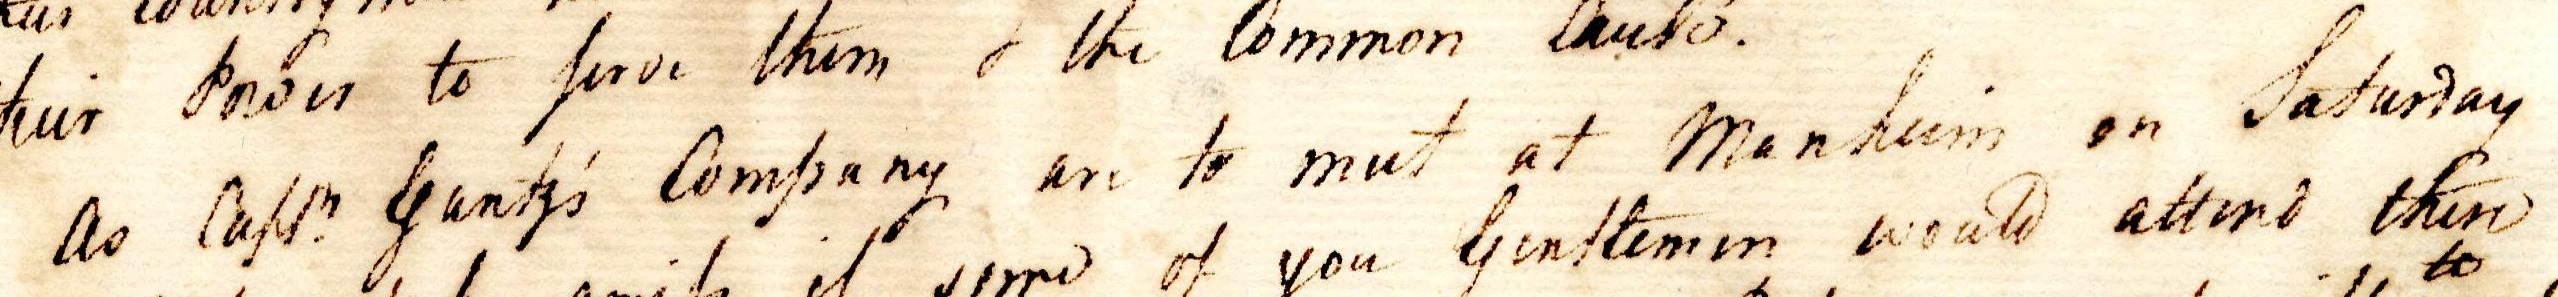As Capt^r. Gantz's Company are to meet at Manheim on Saturday
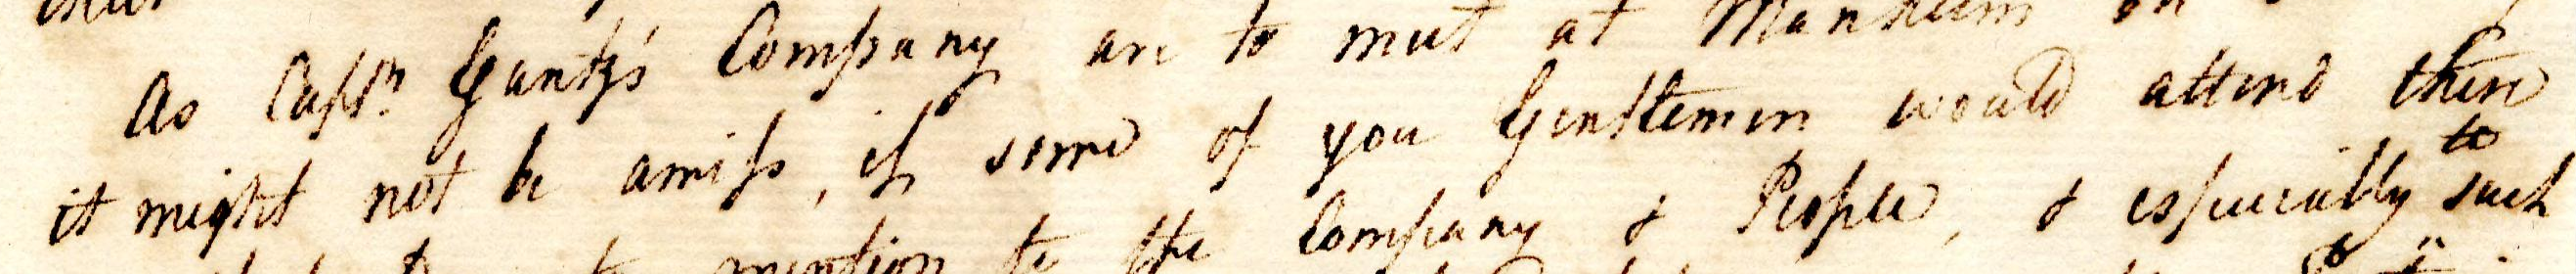it might not be amiss, if some of you Gentlemen would attend there
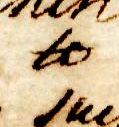to
